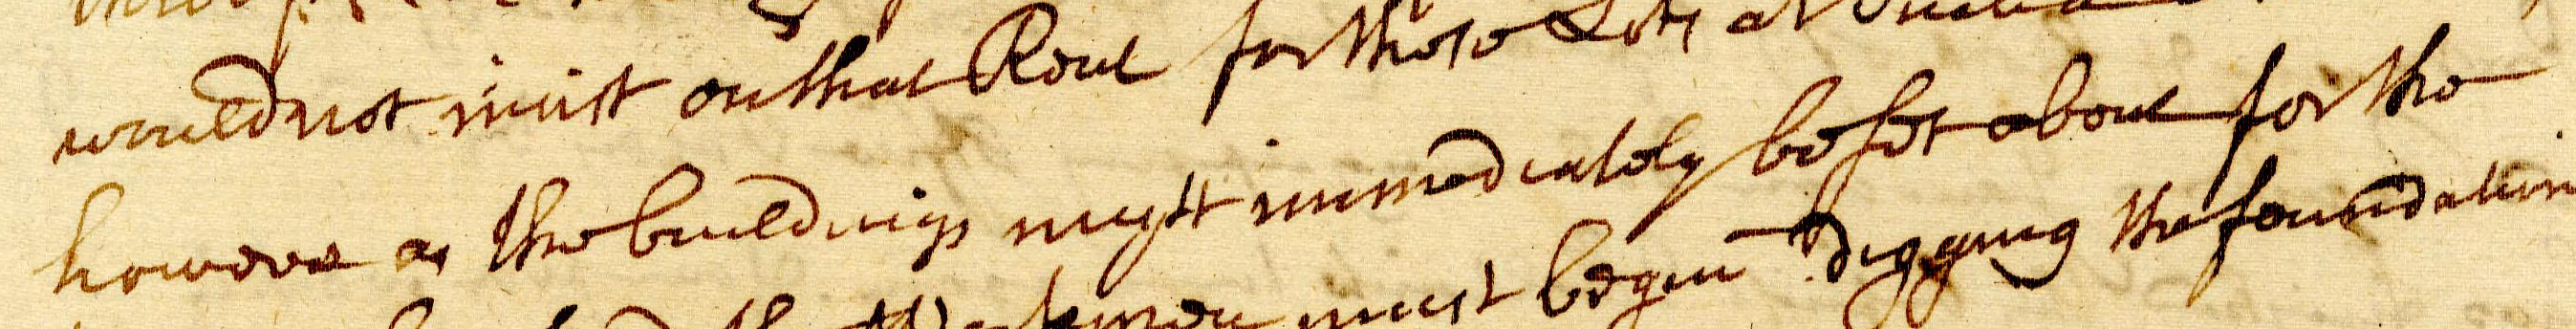however as the buildings might immediately be {set} about for the
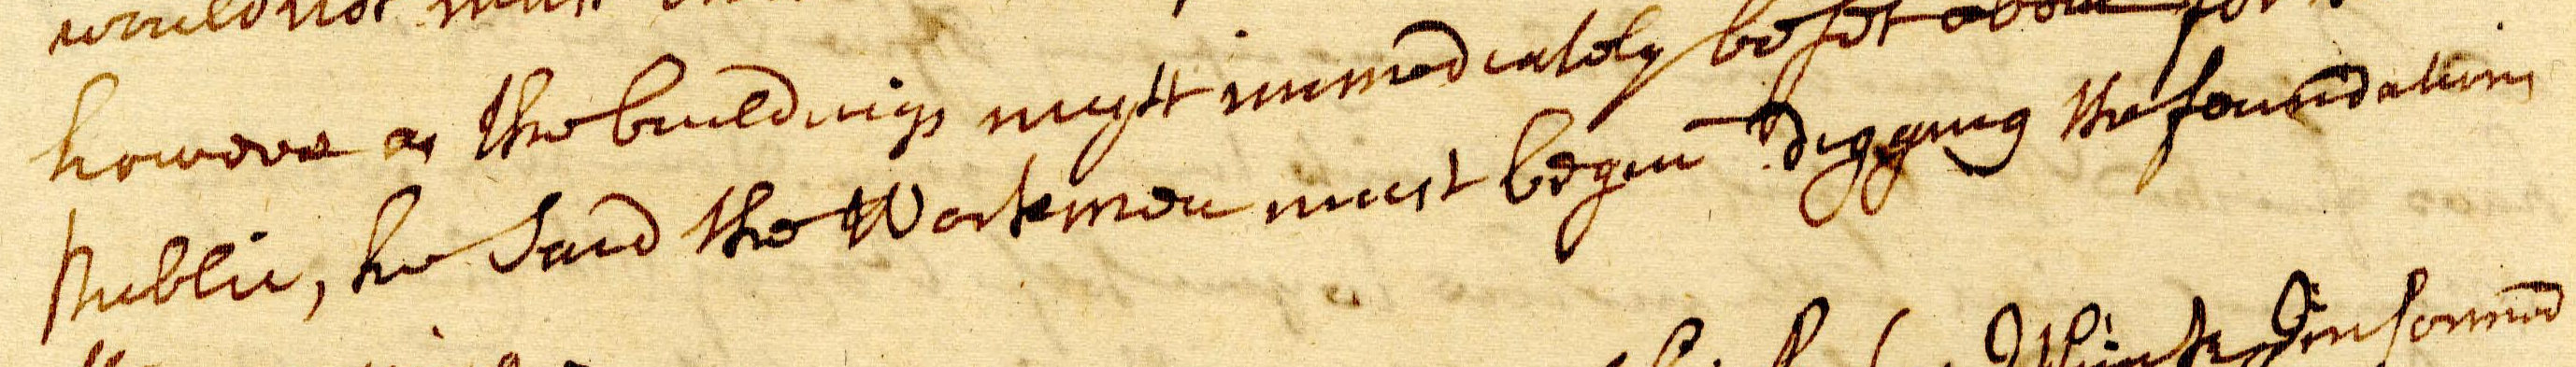Public, he said the Workmen must begin digging the foundations
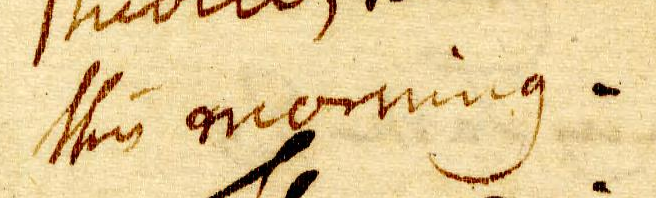this morning.
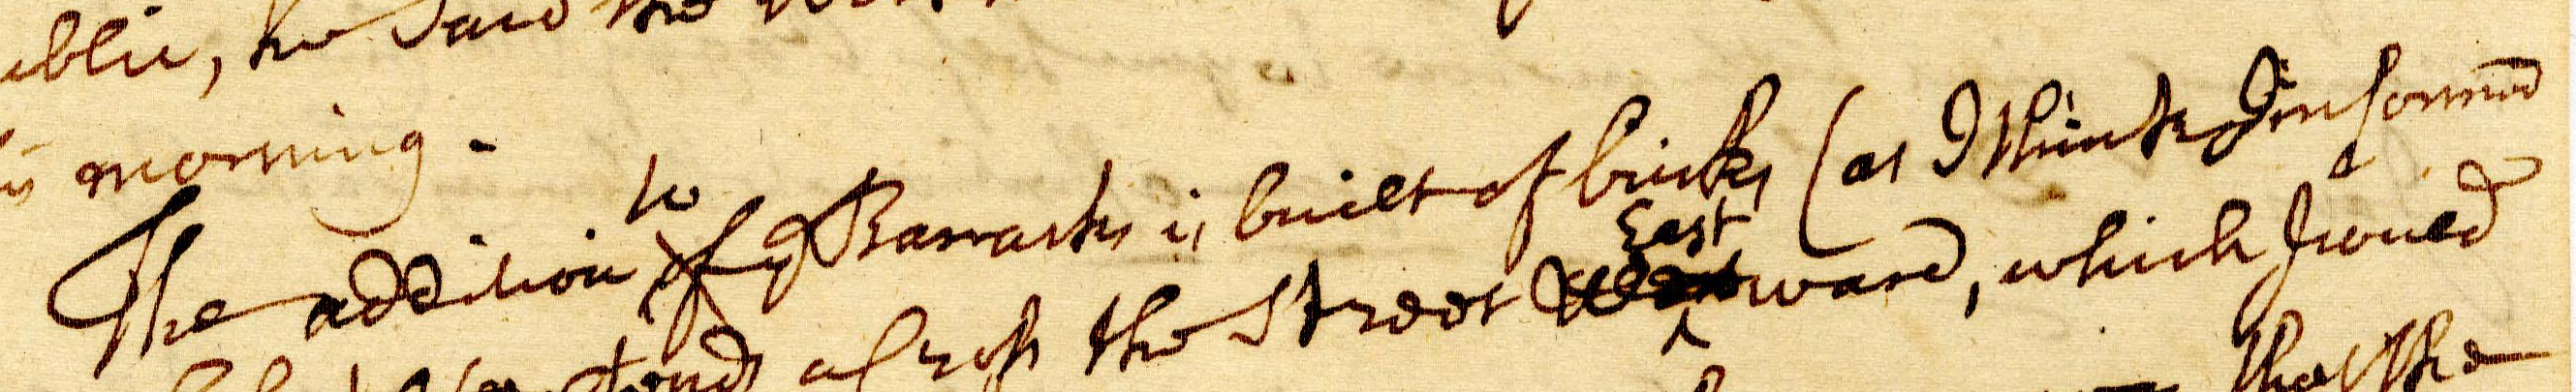The addition [of] Barracks is built of bricks (as I think I informed
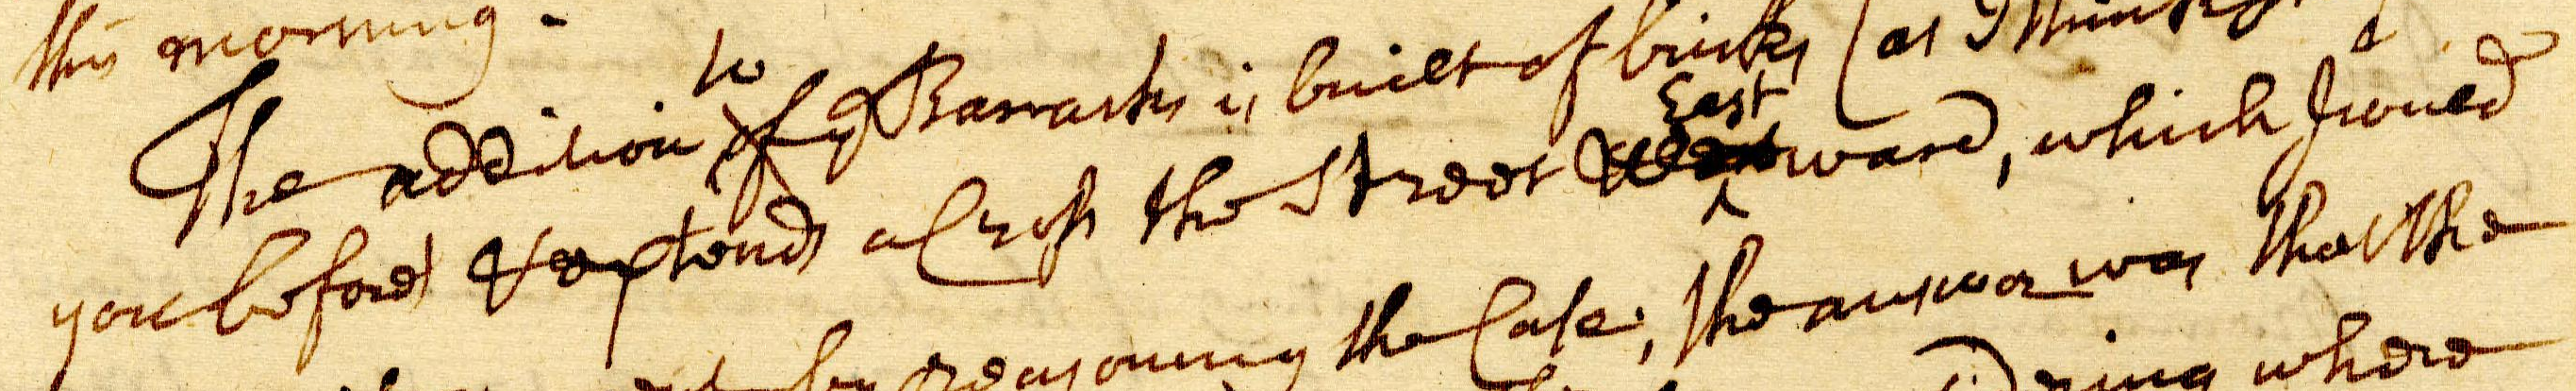you before) & extends aCross the Street [West]ward, which I would
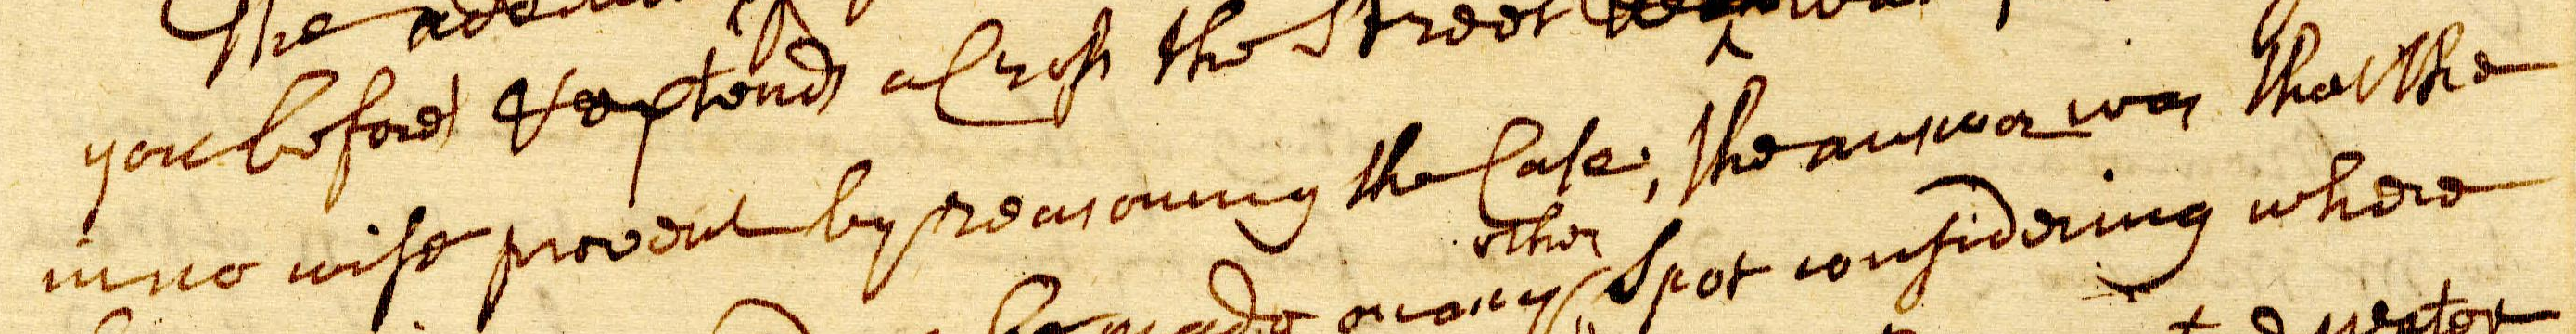in no {wise} prevent by reasoning the Cause; the answer was that the
